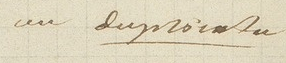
un duplicata
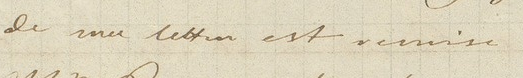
de ma lettre est remise
